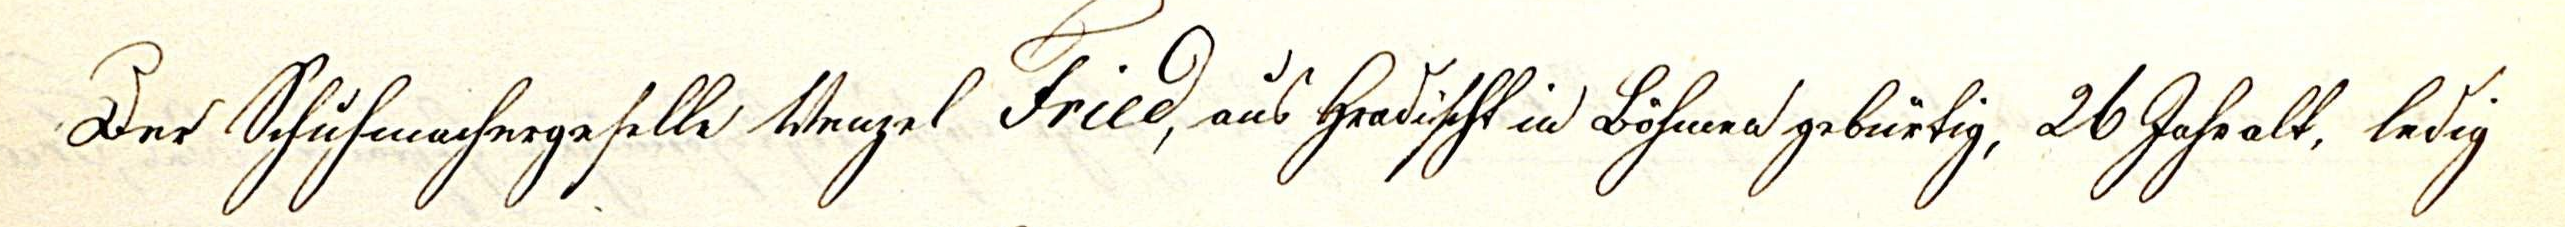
Der Schuhmachergeselle Wenzel Fried, aus Hradischt in Böhmen gebürtig, 26 Jahr alt, ledig
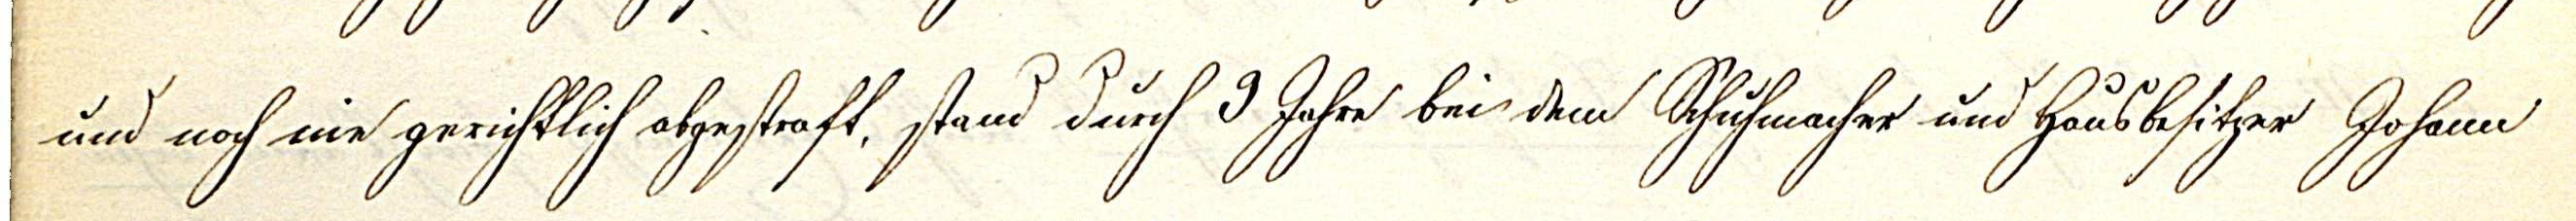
und noch nie gerichtlich abgestraft, stand durch 3 Jahre bei dem Schuhmacher und Hausbesitzer Johann
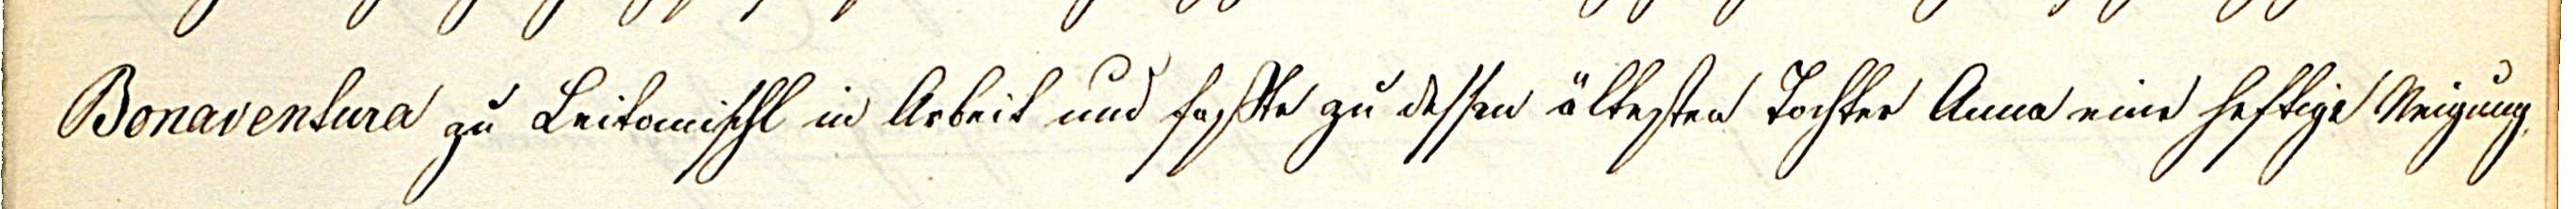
Bonaventura zu Leitomischl in Arbeit und faßte zu dessen ältesten Tochter Anna eine heftige Neigung
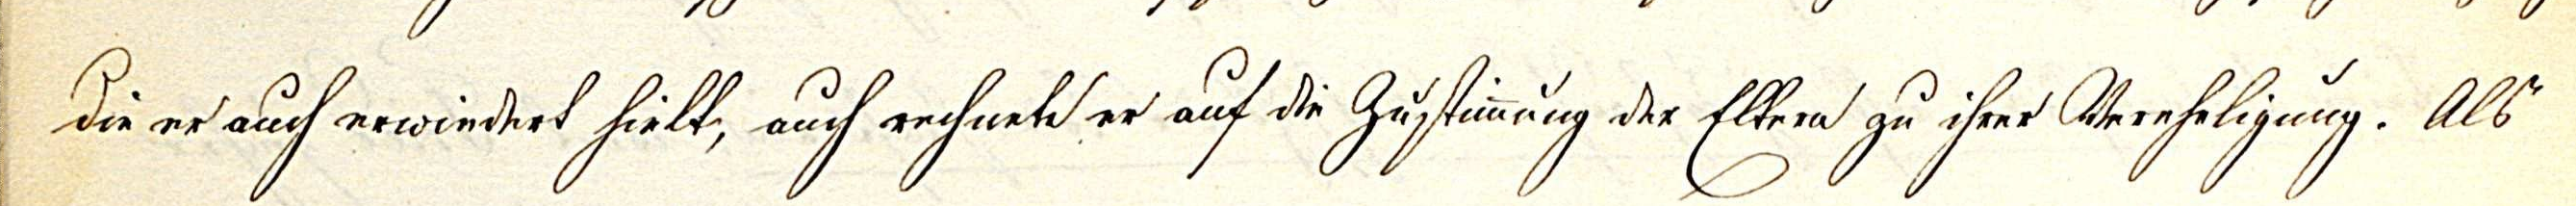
die er auch erwiedert hielt, auch rechnete er auf die Zustimmung der Eltern zu ihrer Verehelichung. Als
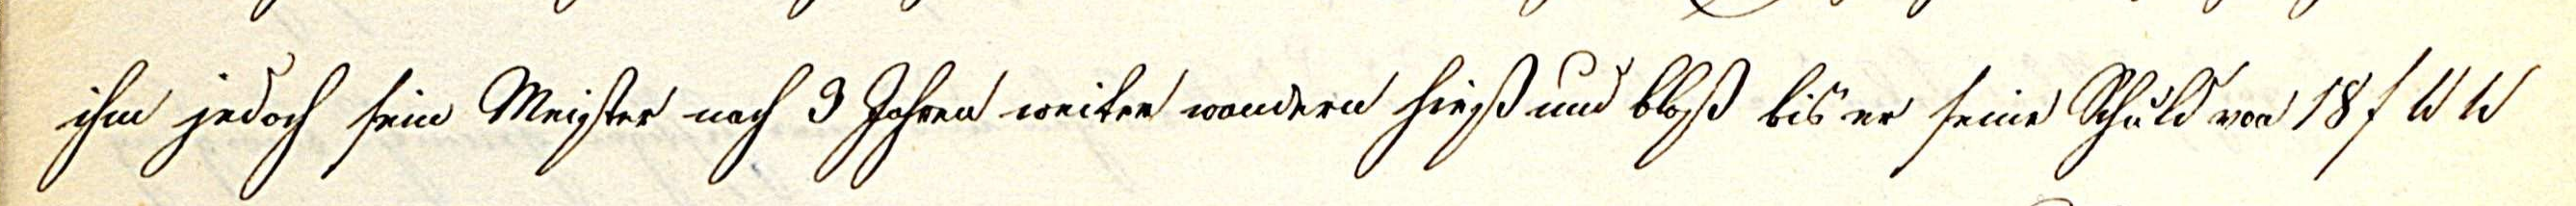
ihm jedoch sein Meister nach 3 Jahren weiter wandern hieß und bloß bis er seine Schuld von 18f WW
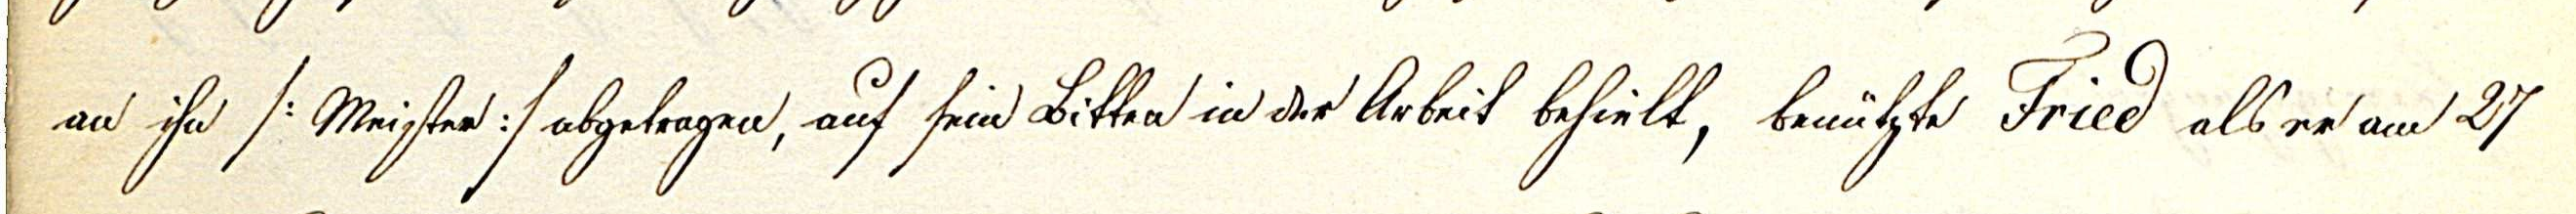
an ihn (Meister) abgetragen, auf sein Bitten in der Arbeit behielt, benützte Fried als er am 27
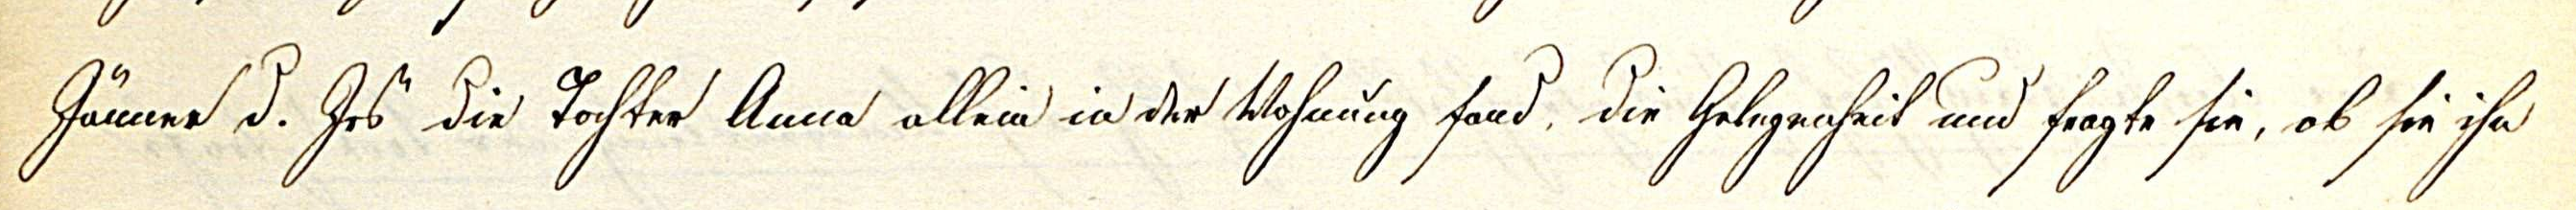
Jänner d. Jrs die Tochter Anna allein in der Wohnung fand, die Gelegenheit und fragte sie, ob sie ihn
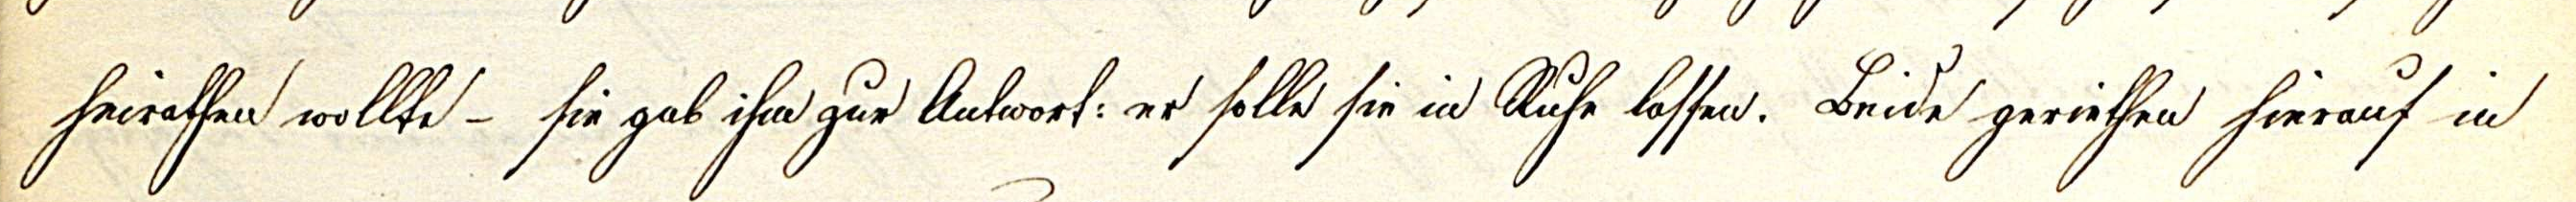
heiraten wollte – sie gab ihm zur Antwort: er solle sie in Ruhe lassen. Beide geriethen hierauf in
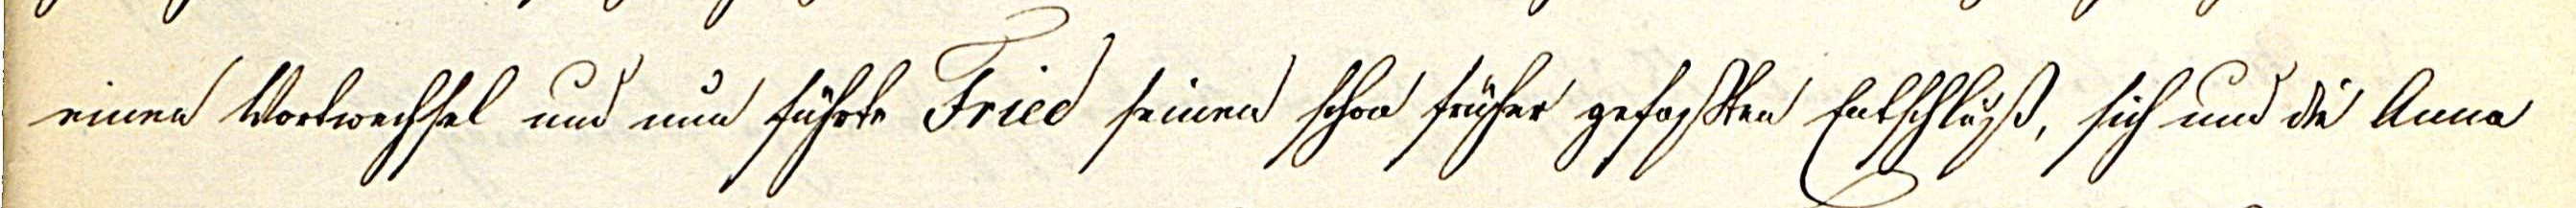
einen Wortwechsel und nun führte Fried seiner schon früher gefaßten Entschluß, sich und die Anna
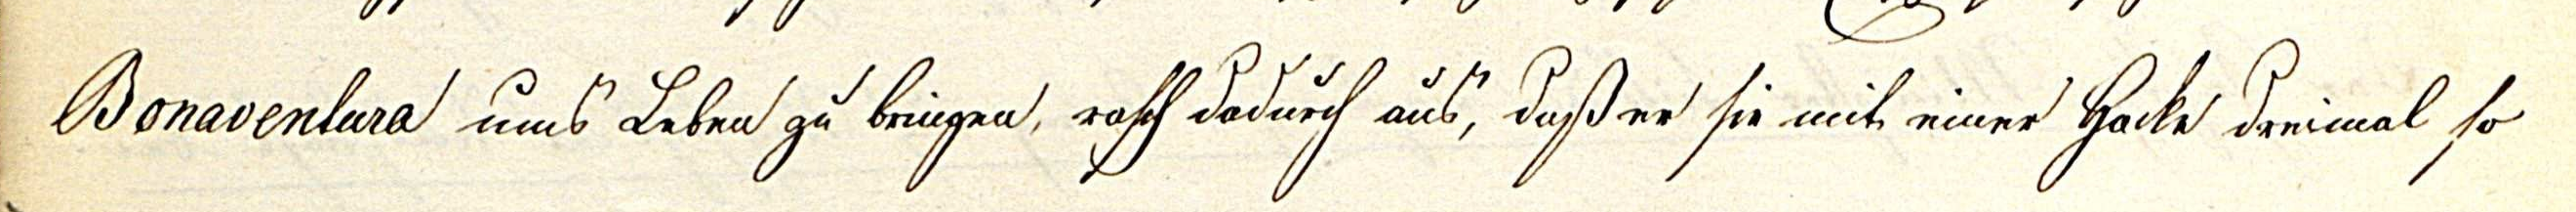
Bonaventura ums Leben zu bringen, rasch dadurch aus, daß er sie mit einer Hacke dreimal so
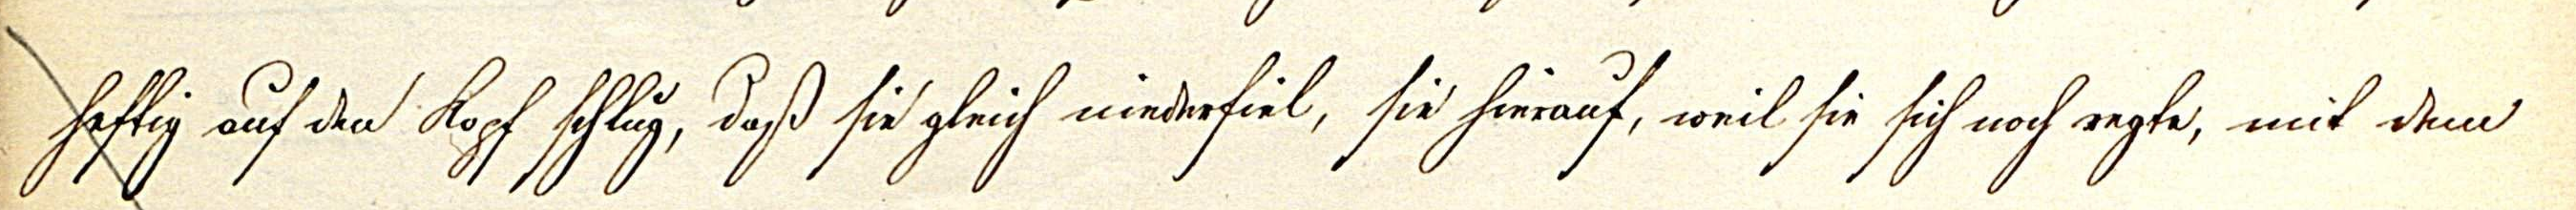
heftig auf den Kopf schlug, daß sie gleich wiederfiel, sie hierauf, weil sie sich noch regte, mit dem
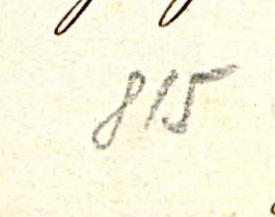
815
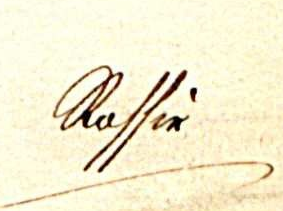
Rossie
